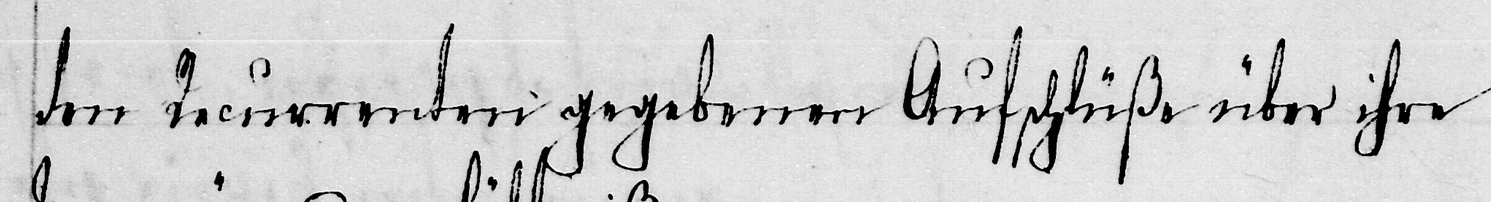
den Recurrenten gegebenen Aufschlüße über ihre
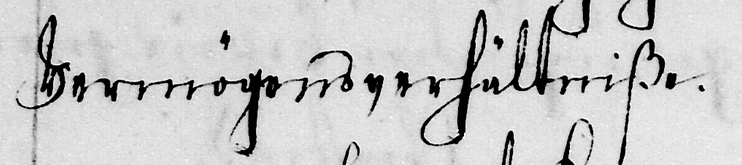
Vermögensverhältniße.
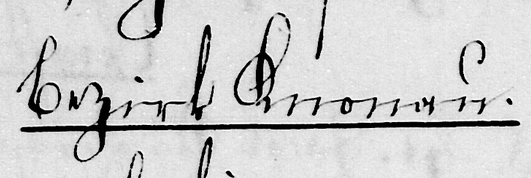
Bezirk Knonau.
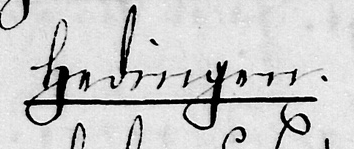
Hedingen.
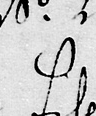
64.
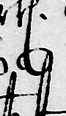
8.
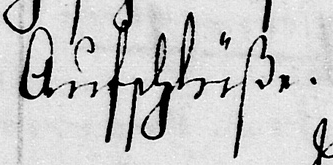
Aufschlüße.
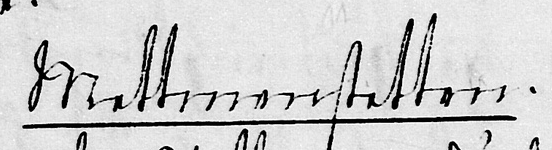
Mettmenstetten.
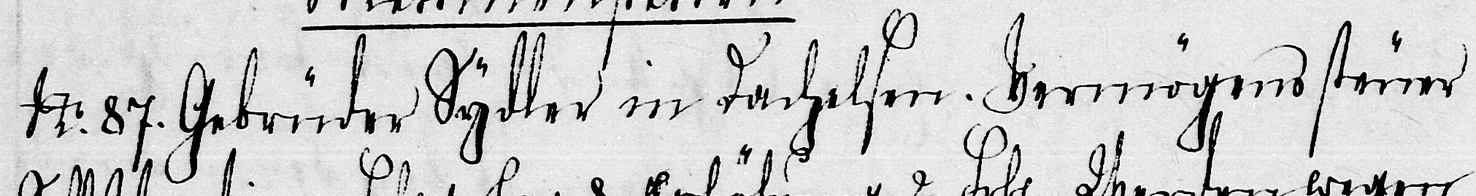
No. 87. Gebrüder Sydler in Dachelsen. Vermögenssteue¬
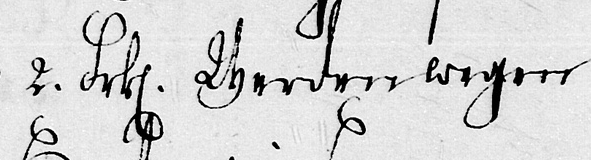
2. Frk[en]. Werden wegen
